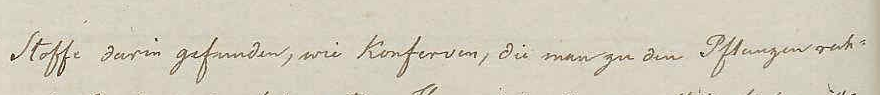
Stoffe darin gefunden, wie Konferven, die man zu den Pflanzen rech-
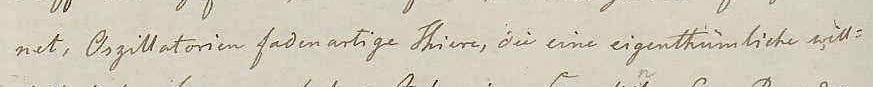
net, Oszillatorien fadenartige Thiere, die eine eigenthümliche will-
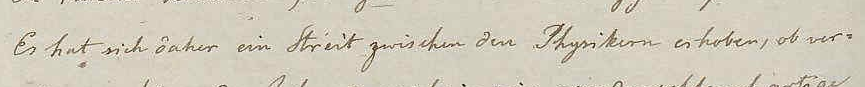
Es hat sich daher ein Streit zwischen den Physikern erhoben, ob ver-
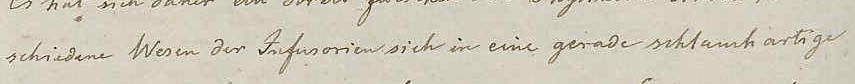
schiedene Wesen der Infusorien sich in eine gerade schlauchartige
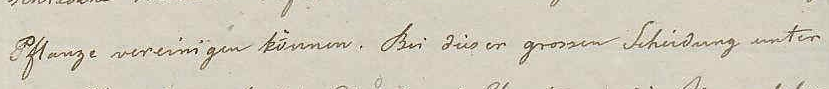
Pflanze vereinigen können. Bei dieser grossen Scheidung unter
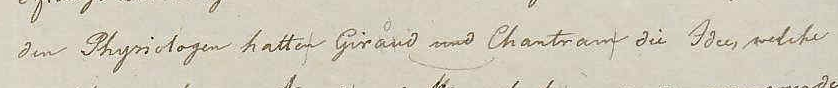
den Physiologen hatten Giraud und oChantramn die Idee, welche
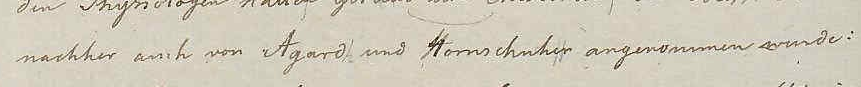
nachher auch von Agardh und Hornschuher angenommen wurde:
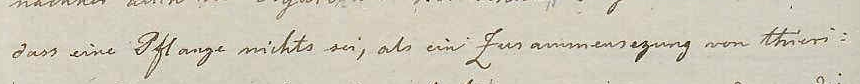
dass eine Pflanze nichts sei, als ein Zusammensezung von thieri-
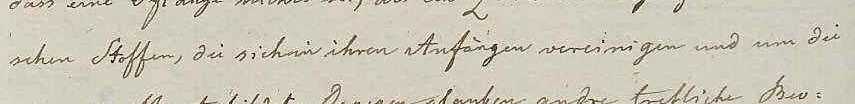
schen Stoffen, die sich in ihren Anfängen vereinigen und um die
